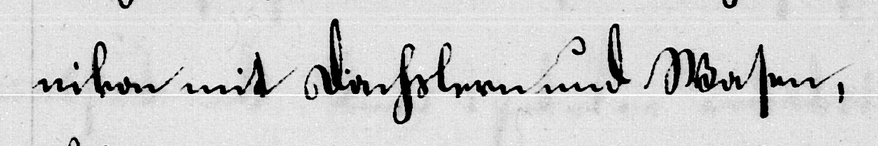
nikon mit Dachslern und Wasen,
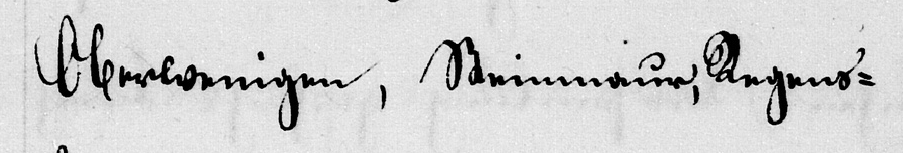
Oberwenigen, Steinmaur, Regens¬
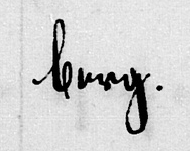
berg.
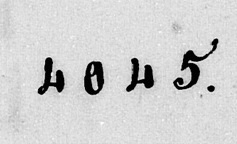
4045.
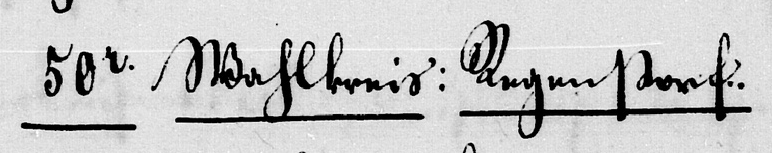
50r. Wahlkreis: Regensdorf.
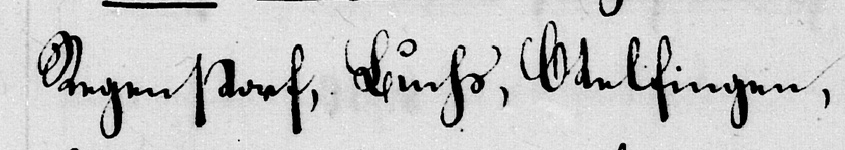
Regensdorf, Buchs, Otelfingen,
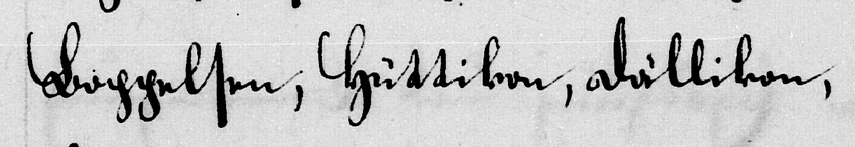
Boppelsen, Hüttikon, Dällikon,
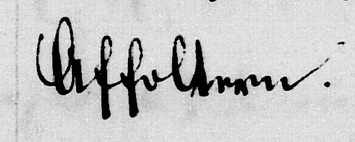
Affoltern.
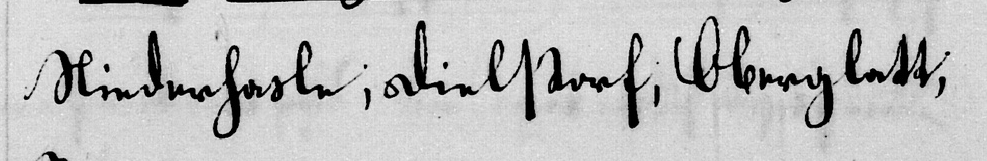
Niederhasle, Dielsdorf, Oberglatt,
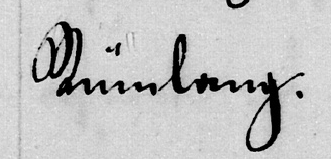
Rümlang.
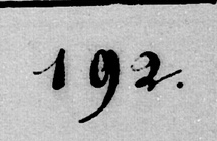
192.
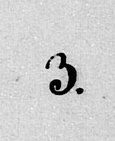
3.
